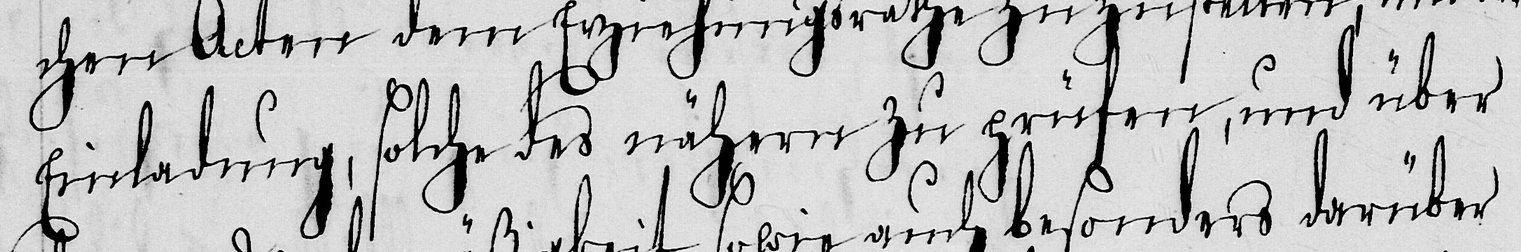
Einladung, solche des nähren zu prüfen, und über
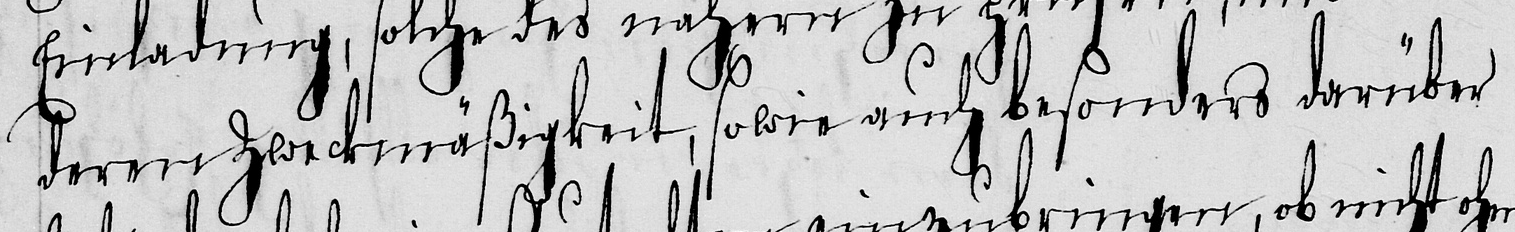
deren Zweckmäßigkeit, sowie auch besonders darüber
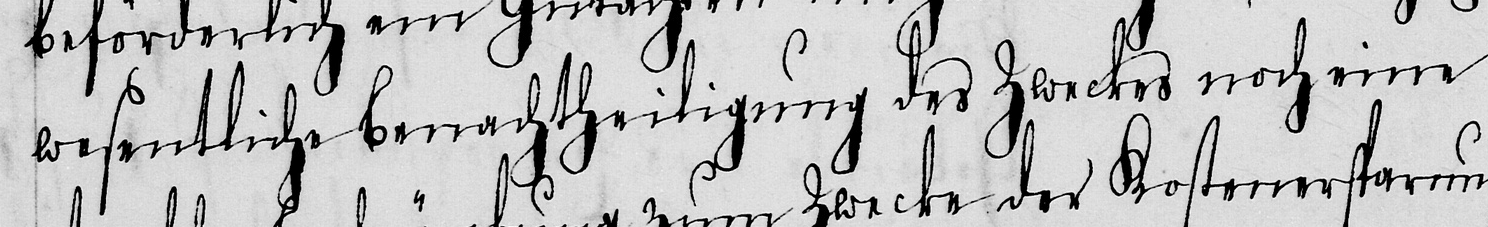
wesentliche Benachtheiligung des Zweckes noch eine
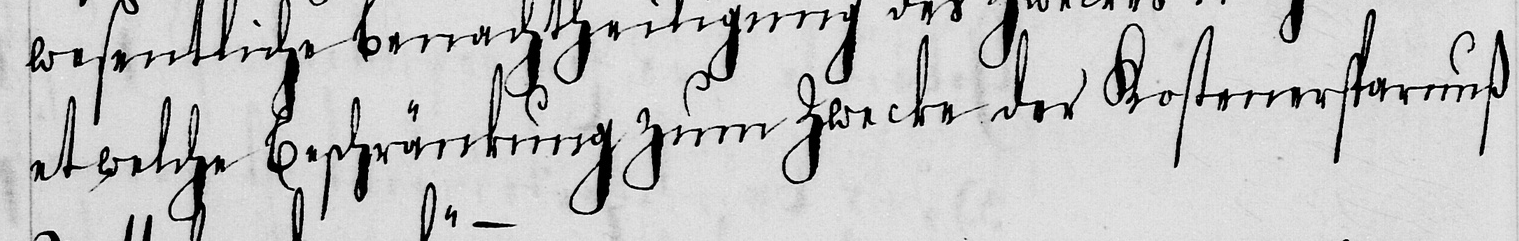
etwelche Beschränkung zum Zwecke der Kostenersparnuß
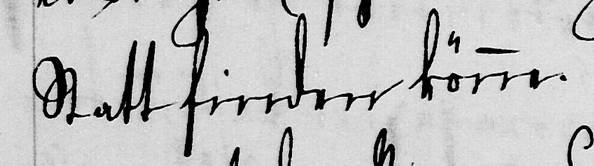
Statt finden könne.
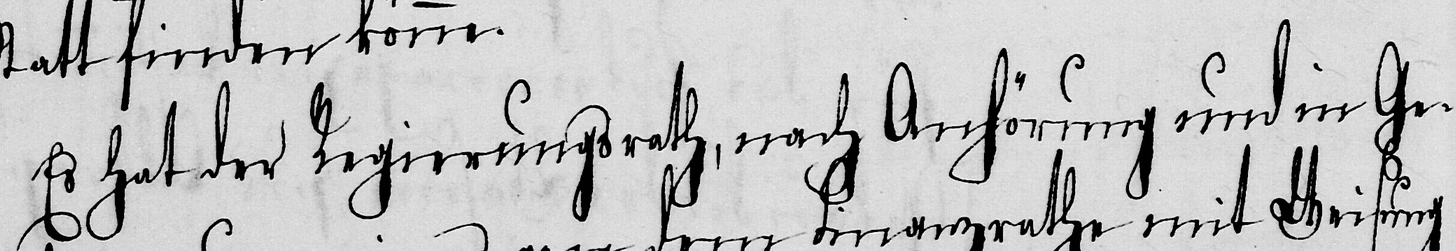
Es hat der Regierungsrath, nach Anhörung und in Ge¬
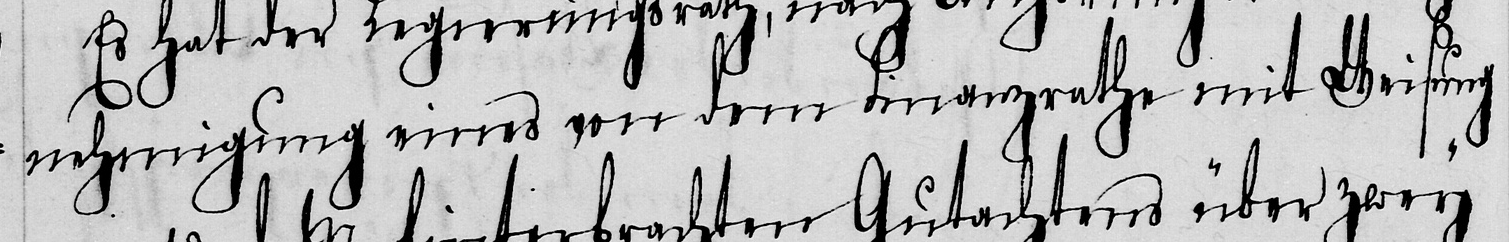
nehmigung eines von dem Finanzrathe mit Weisung
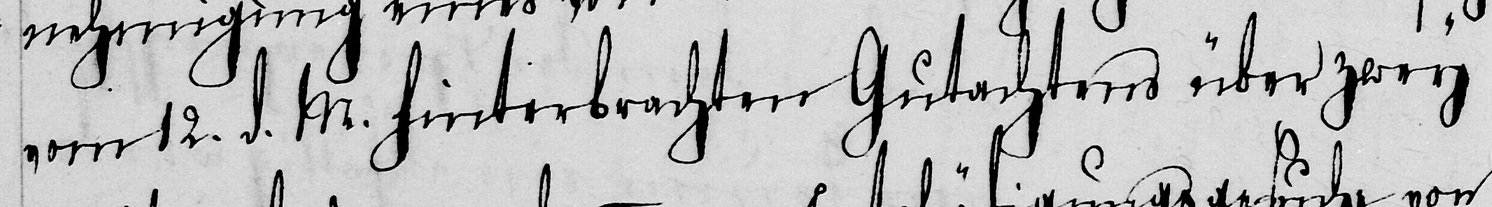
vom 12. d. M. hinterbrachten Gutachtens über zwey
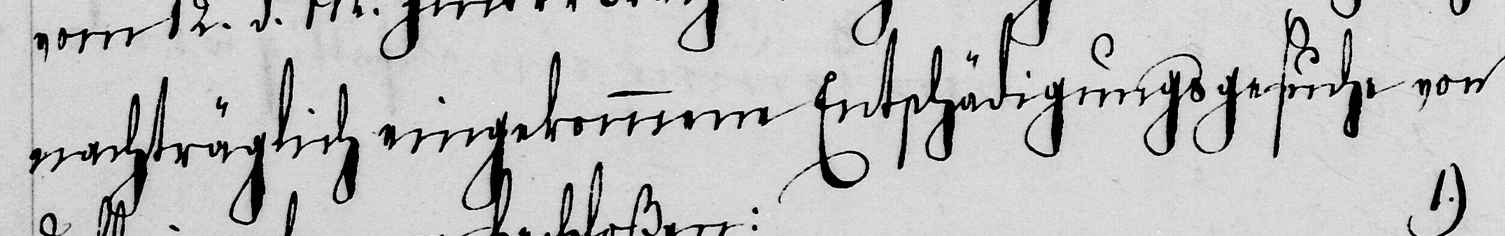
nachträglich eingekommene Entschädigungsgesuche von
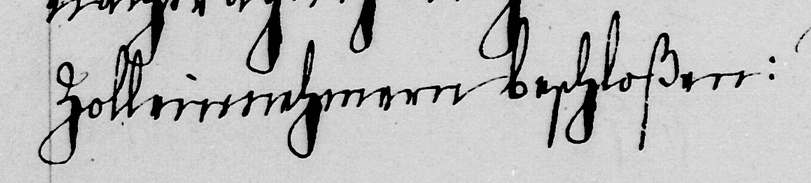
Zolleinnehmern beschloßen:
